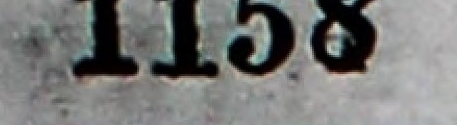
1158
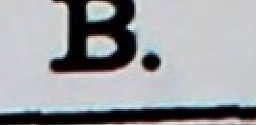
B.
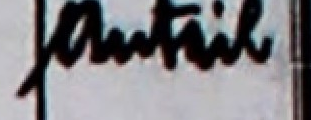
Anteil
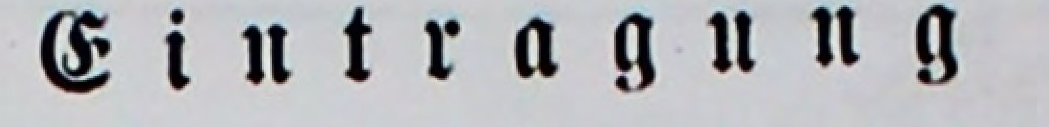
Eintragung
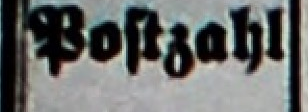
Postzahl
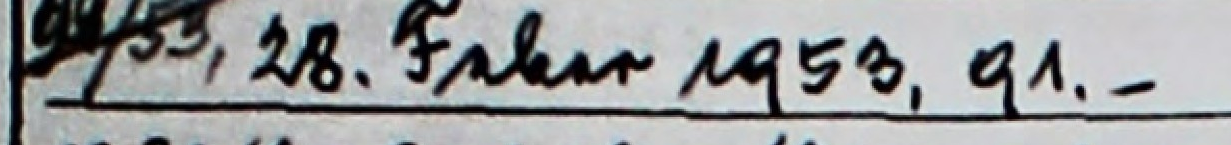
91/53, 28. Feber 1953, 91.-
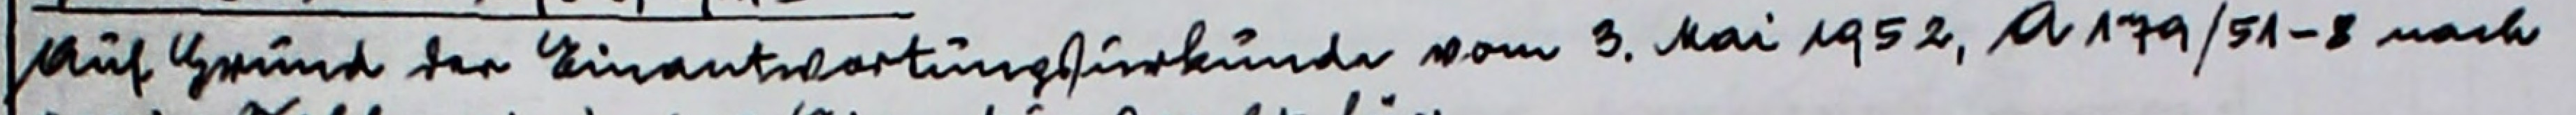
Auf Grund der Einantwortungsurkunde vom 3. Mai 1952, A 179/51-8 nach
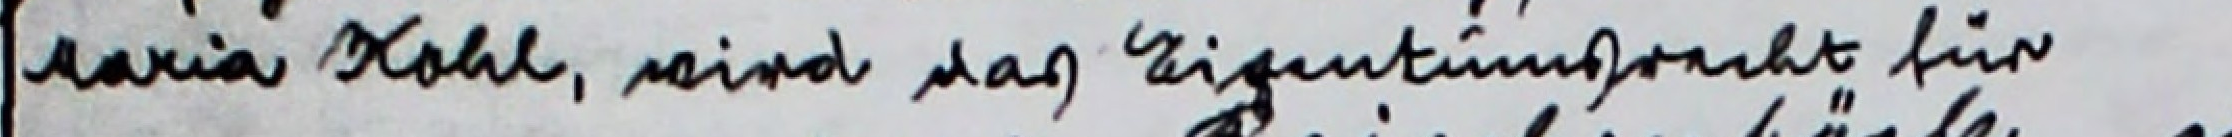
Maria Kohl. wird das Eigentumsrecht für
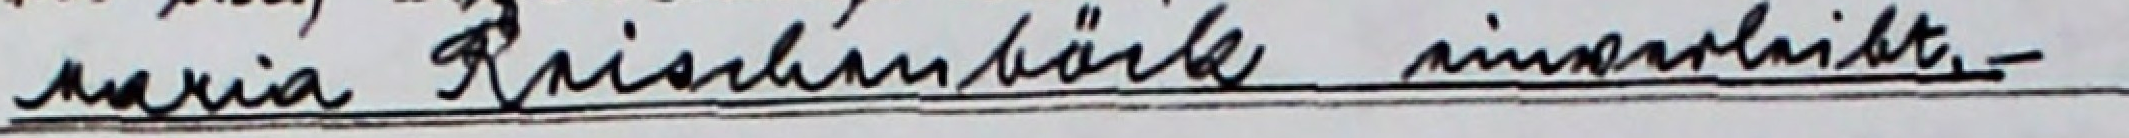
Maria Reischenböck einverleibt.-
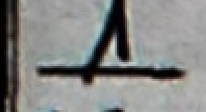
1
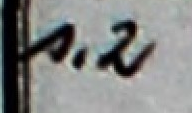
s. 2
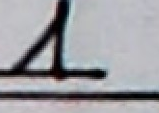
1
